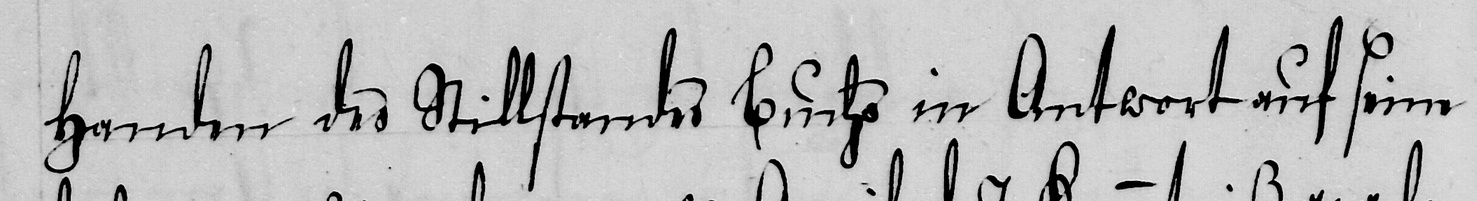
Handen des Stillstandes Buchs in Antwort auf seine
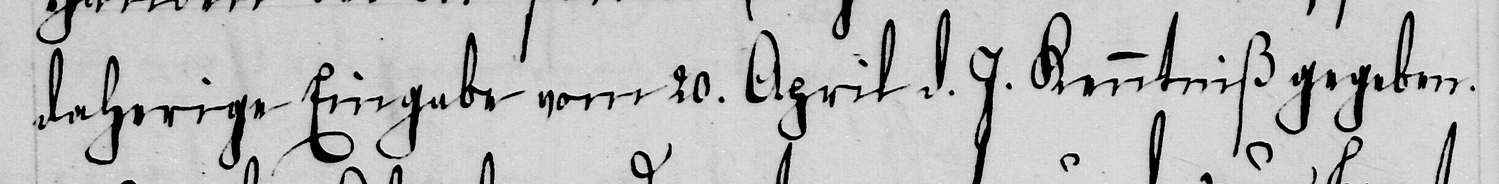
daherige Eingabe vom 20. April d. J. Kenntniß gegeben.
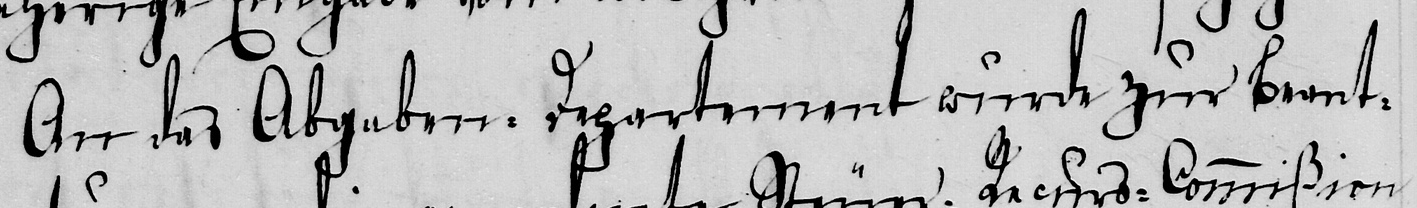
An das Abgaben-Departement wurde zur Beant¬
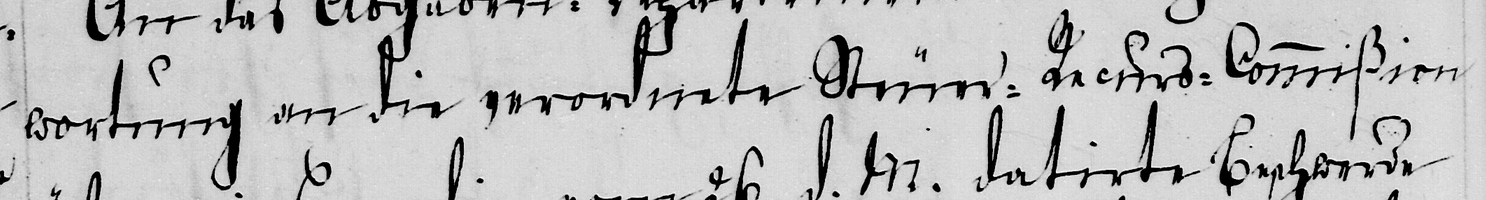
wortung an die verordnete Steuer-Recurs-Commißion
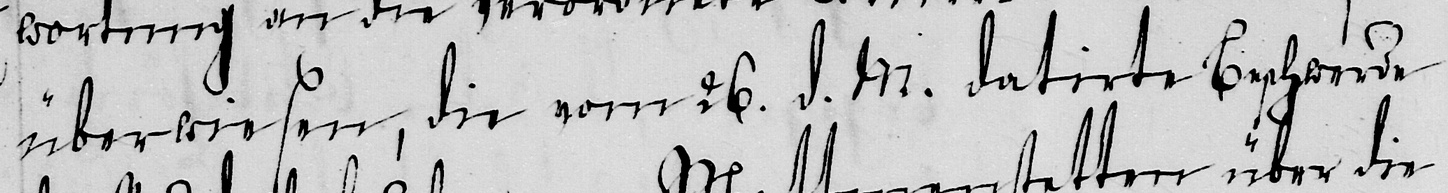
überwiesen, die vom 26. d. M. datirte Beschwerde
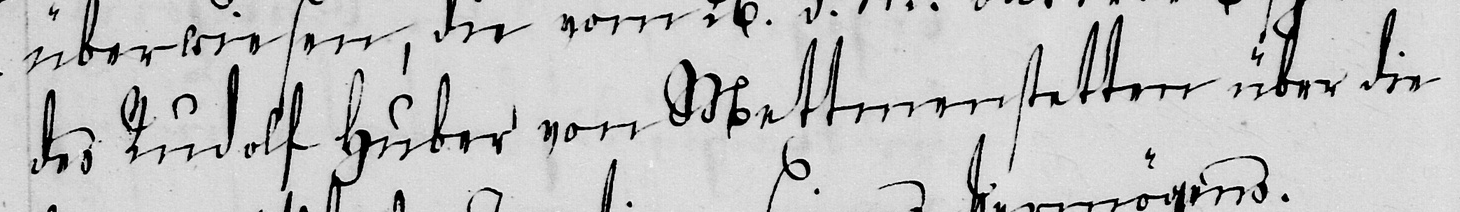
des Rudolf Huber von Mettmenstetten über die
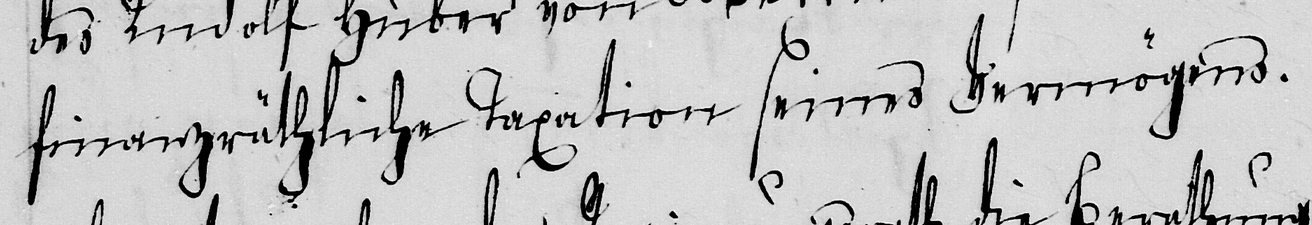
finanzräthliche Taxation seines Vermögens.
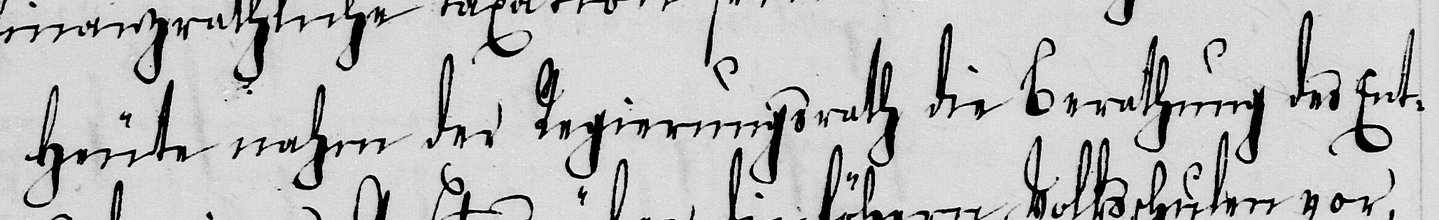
Heute nahm der Regierungsrath die Berathung des Ent¬
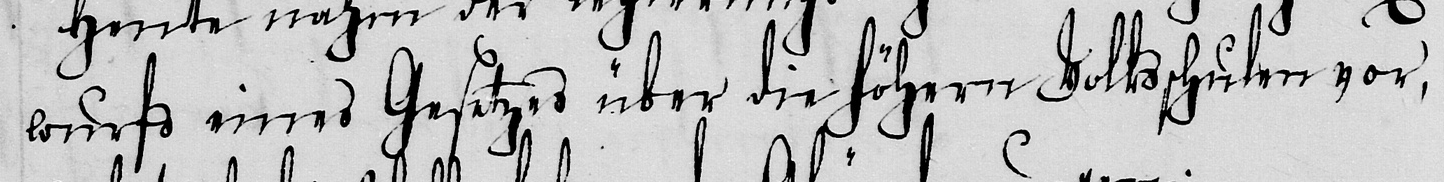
wurfs eines Gesetzes über die höhern Volksschulen vor,
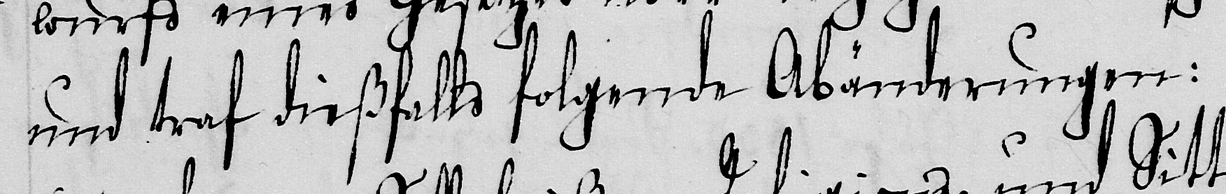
und traf dießfalls folgende Abänderungen:
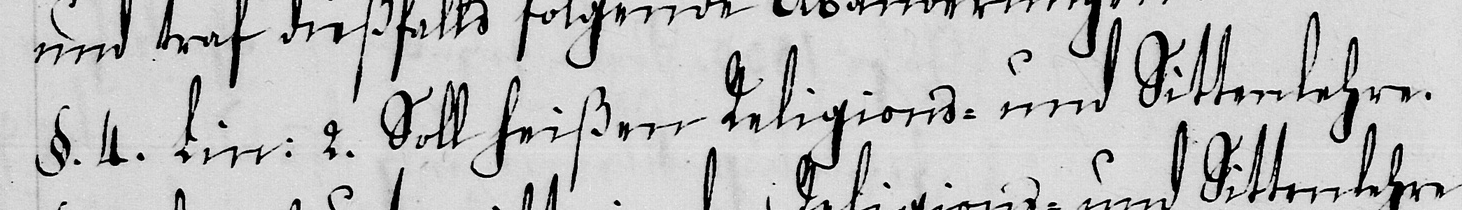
§. 4. Lin: 2. Soll heißen Religions- und Sittenlehre.
